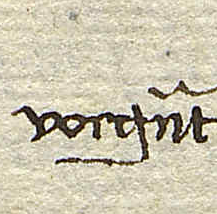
vorgnt*
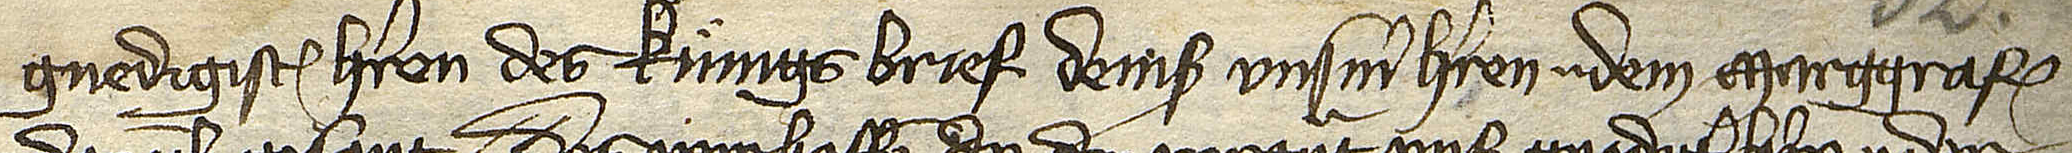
gnedigiſt* h*ren des künigs brief demſ* vnſm* h*ren ~ dem Marggraf*
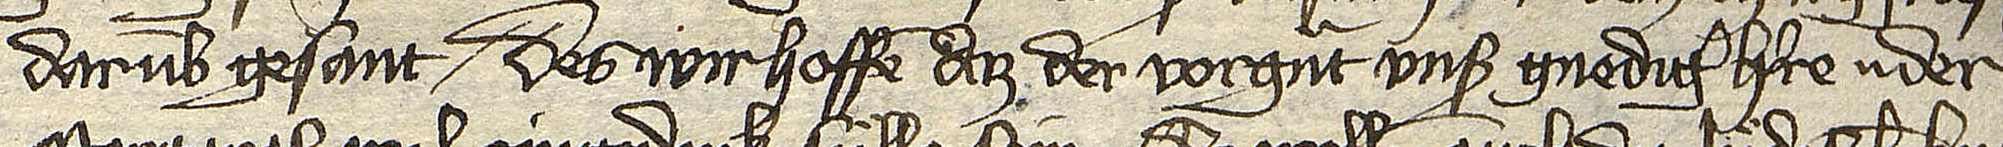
darub* geſant / Des wir hoffe* daʒ der vorgnt* vnſ* gnedig* h*re ~ der
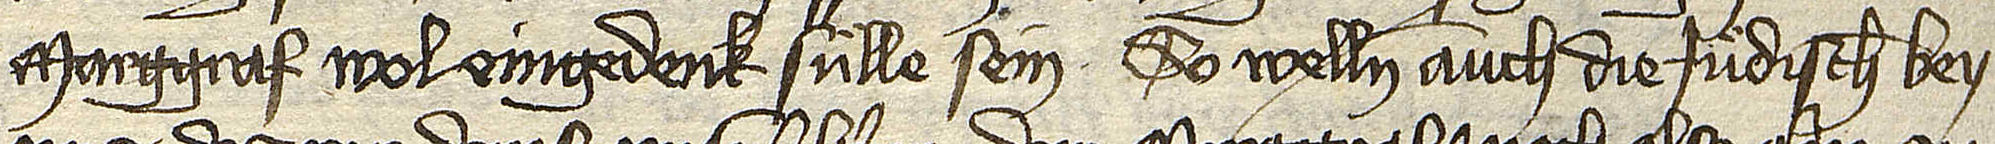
Marggraf wol eingedenk ſülle ſein / So welln* auch die Iüdiſch* bey
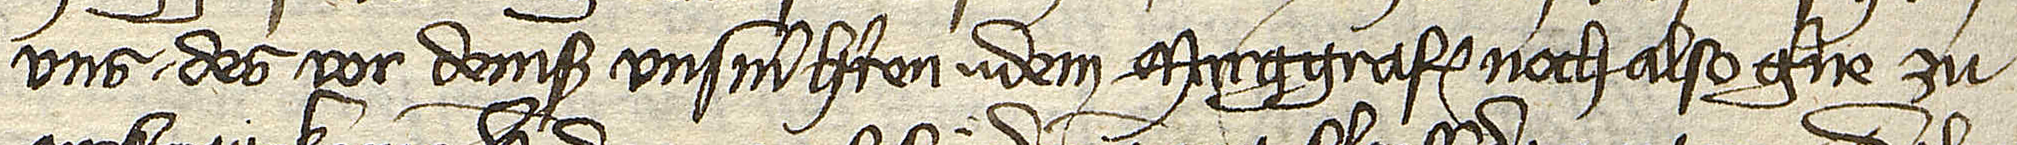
vns / des vor demſ* vnſm* h*ren ~ dem Marggraf* noch alſo g*ne ʒu
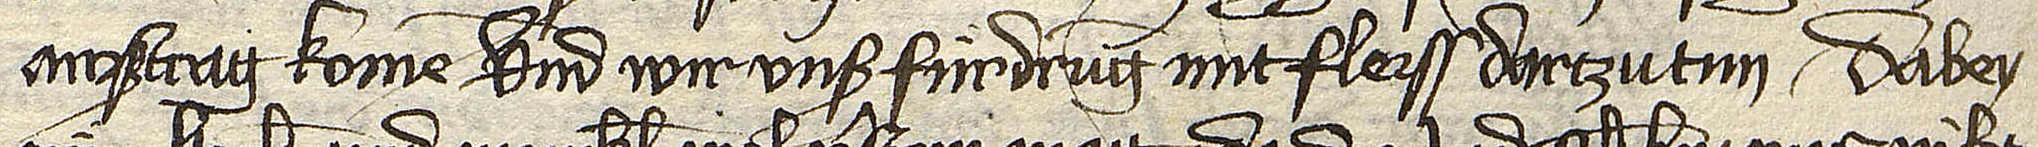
awſʒtrag kome* Vnd wir vnſ* fürdru*g mit fleiſſ darcʒu tun / Dabey
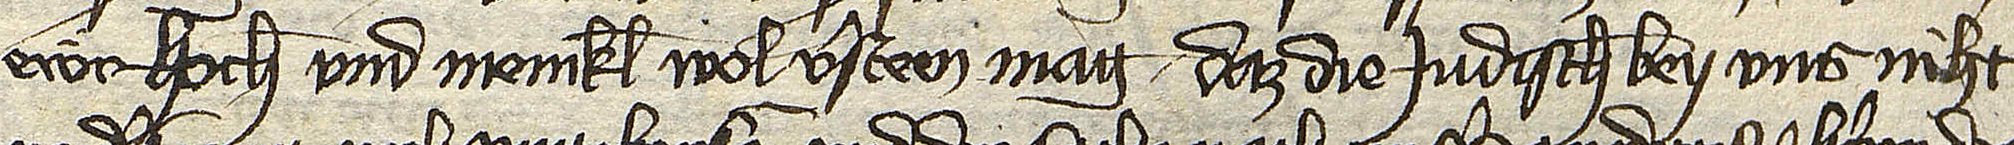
eẅr hoch* vnd menikl* wol v*ſteen mag / daʒ die Iudiſch* bey vns niht
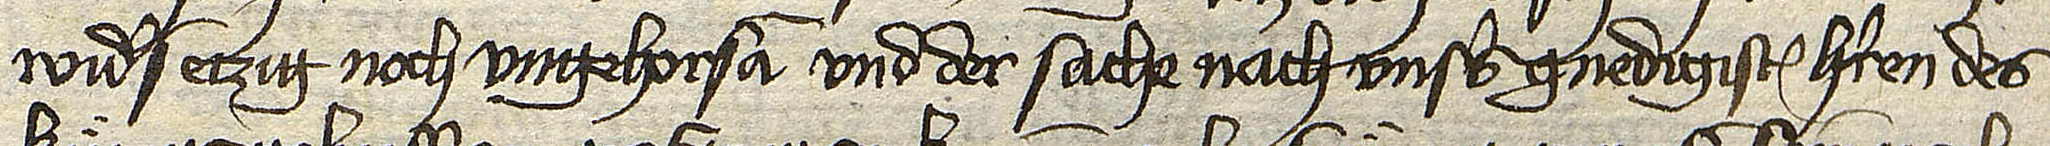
wid*ſecʒig noch vngehorſa* vnd der ſache nach vnſ*s gnedigiſt* h*ren des
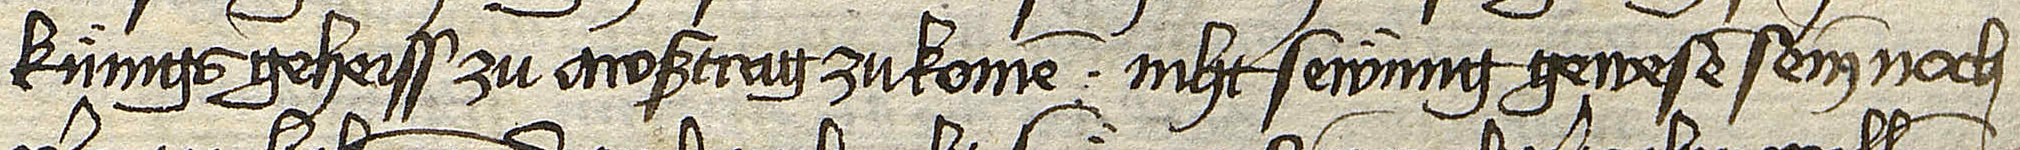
künigs geheiſſ ʒu awſʒtrag ʒu kome* . niht ſeẅmig geweſe* ſein noch
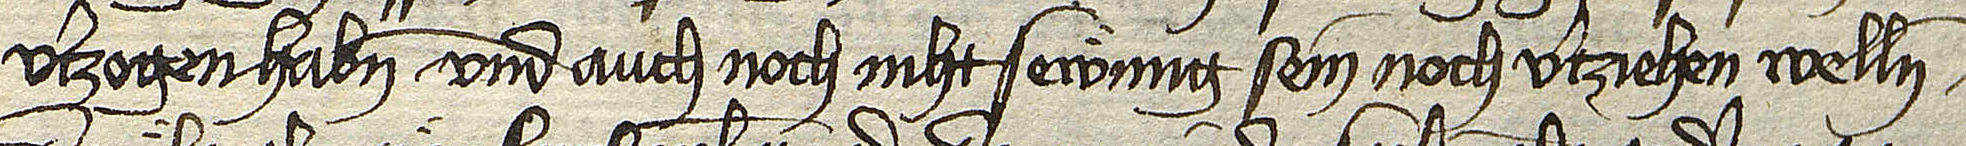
v*cʒogen habn* / vnd auch noch niht ſeẅmig ſein noch v*cʒiehen welln*
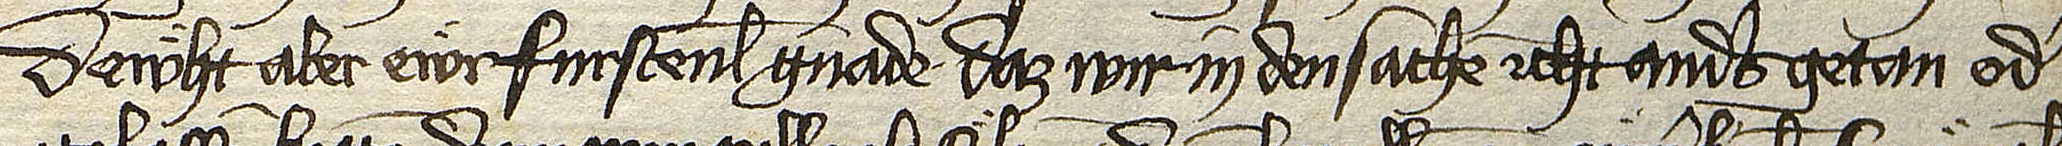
Deẅht aber eẅr furſtenl* gnade / daʒ wir in den ſache* icht and*s getan od*
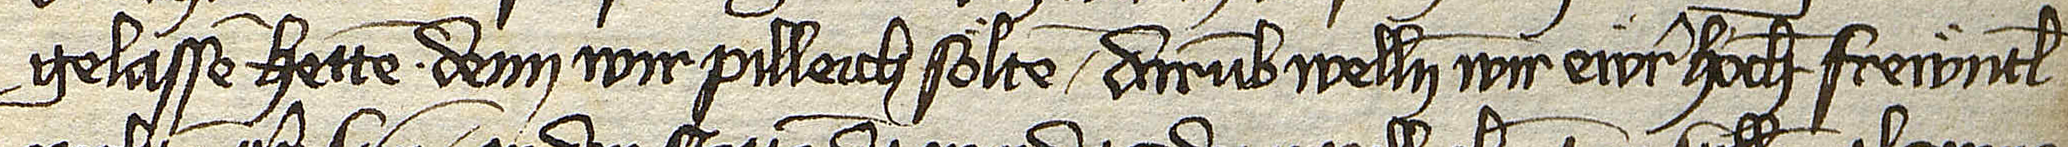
gelaſſe* hette* . denn wir pilleich ſölte* / Darub* welln* wir eẅr* hoch* freẅntl*
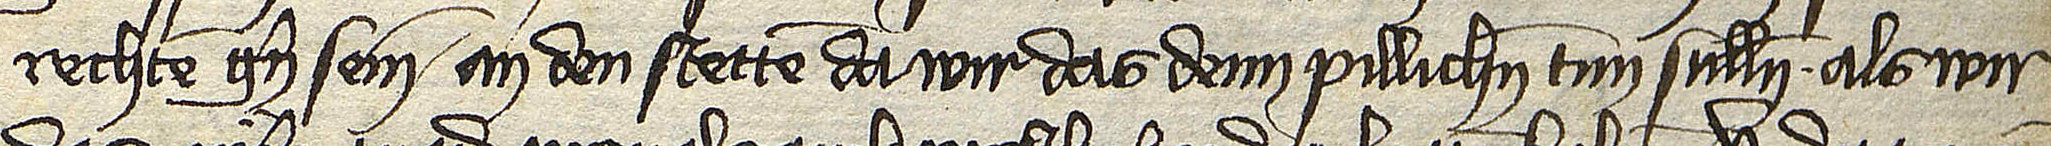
rechte* g*n ſein* / an den ſtette* da wir das denn pillichn* tun ſulln* . als wir
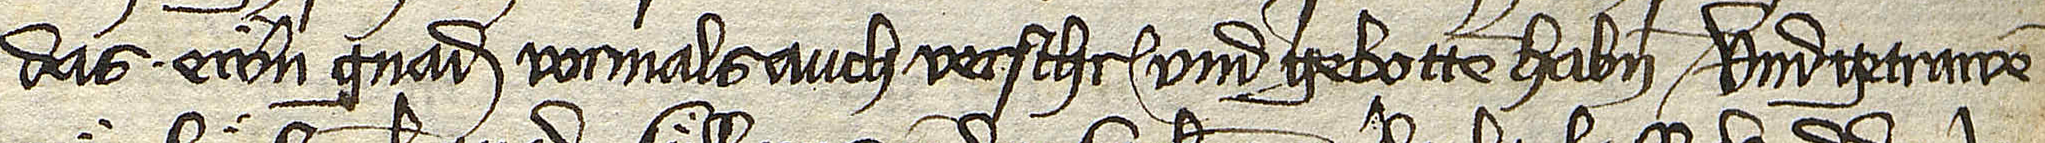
das . eẅ*n gnad* vormals auch verſchr* vnd gebotte* habn* / Vnd getrawe*
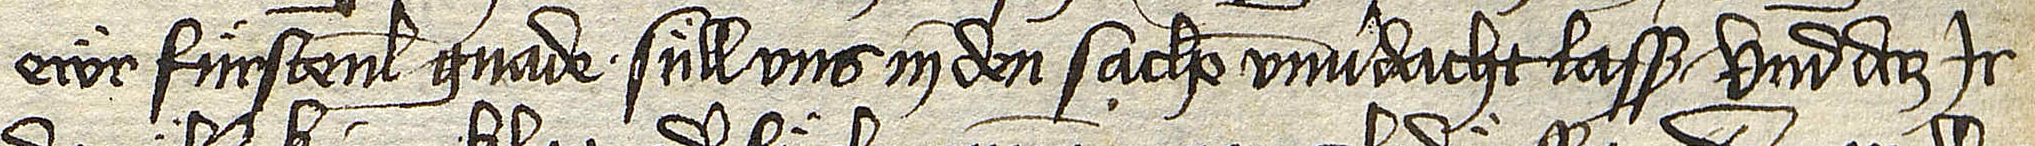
eẅr fürſtenl* gnade . ſüll vns in den ſache* vnu*dacht laſſ* / vnd daʒ Ir
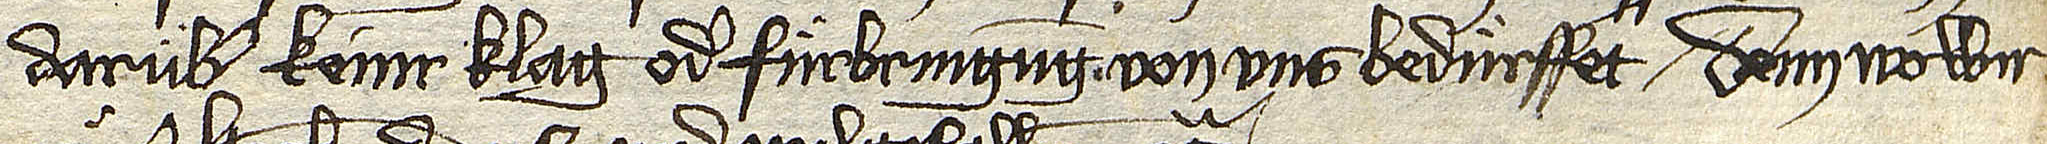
darüb* keinr klag od* fürbringu*g von vns bedürffet / Denn wo wir
